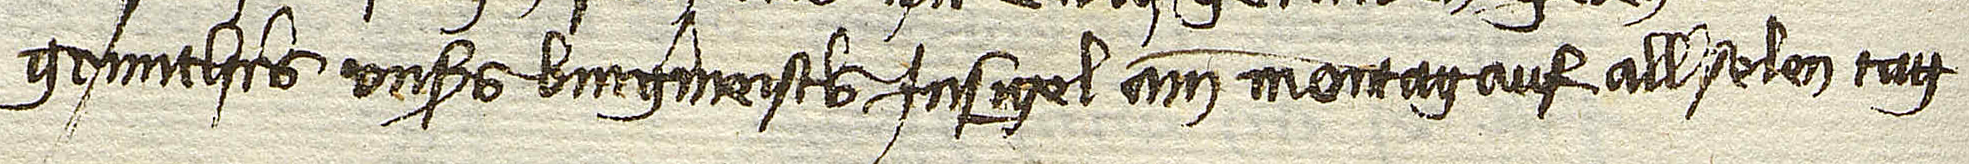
grunthr*s vnſ*s burg*meiſt*s Inſigel am* montag auf all* ſelen tag
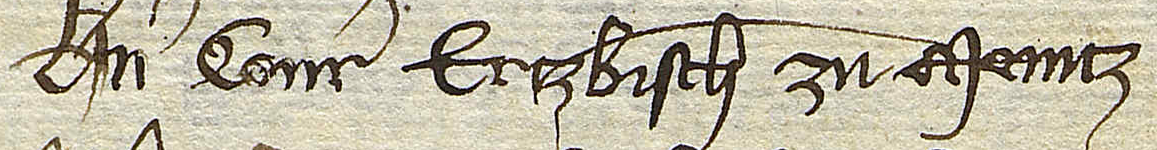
Hn* Conr* Ercʒbiſch* ʒu Meincʒ
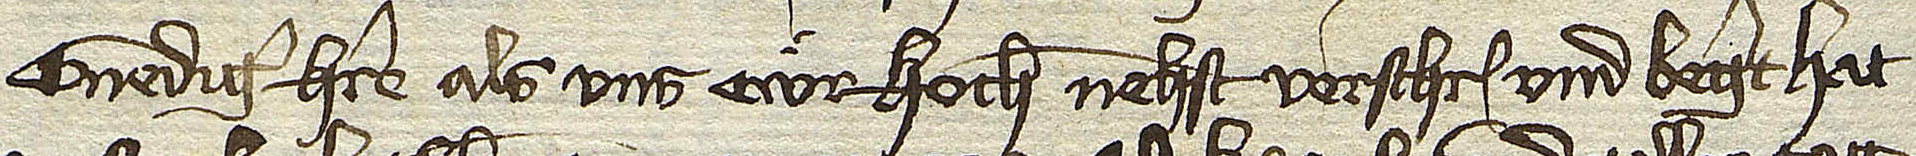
Gnedig* Hr*e als vns ewr Hoch* nehſt verſchr* vnd beg*t hat
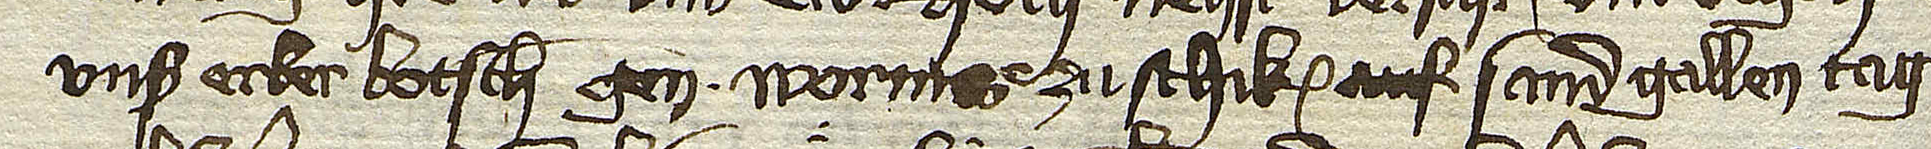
vnſ* erber botſch* gen . worms ʒu ſchik* auf ſand gallen tag
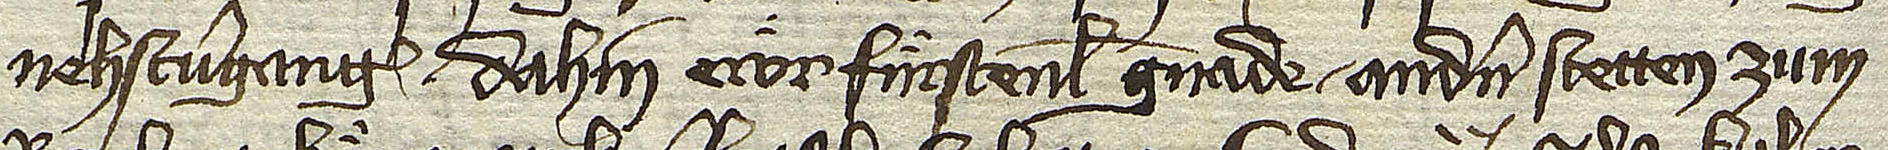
nehſtu*gang* / Dahin ewr fürſtenl* gnade / andn* ſtetten ʒum
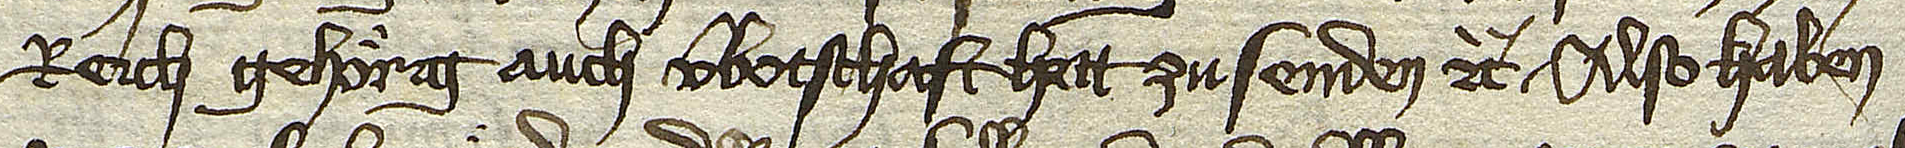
Reich gehörig auch v*botſchaft hett ʒu ſenden ec* / Alſo haben
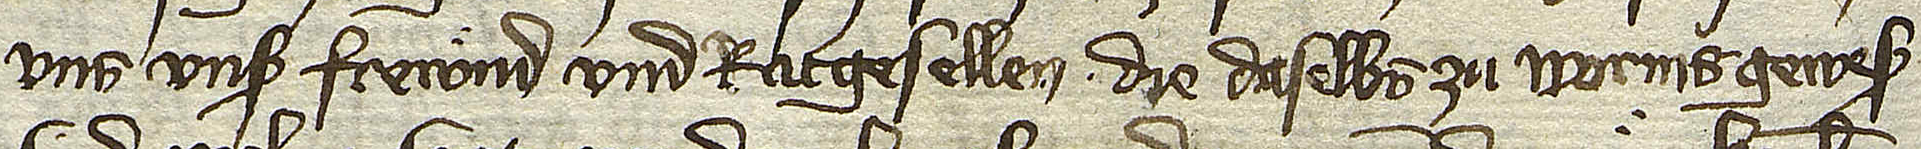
vns vnſ* frewnd vnd Ratgeſellen . die daſelbs ʒu worms geweſ*
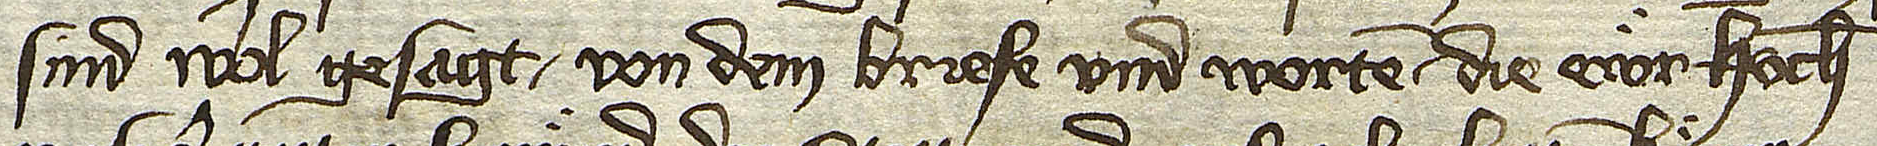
ſind wol geſagt / von dem briefe vnd worte* / die ewr hoch*
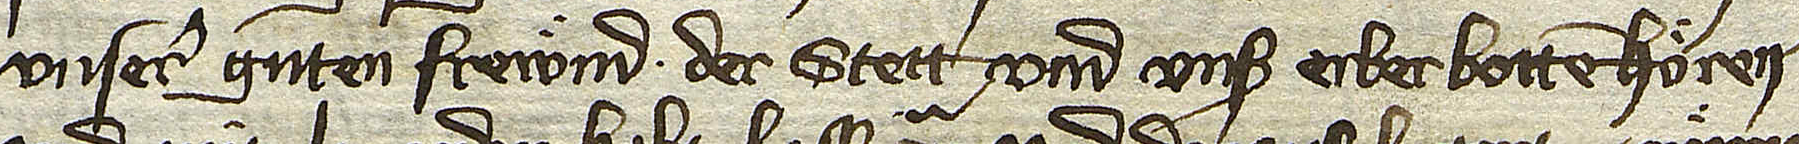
vnſer* guten frewnd . der Stett vnd vnſ* erber botte* hören
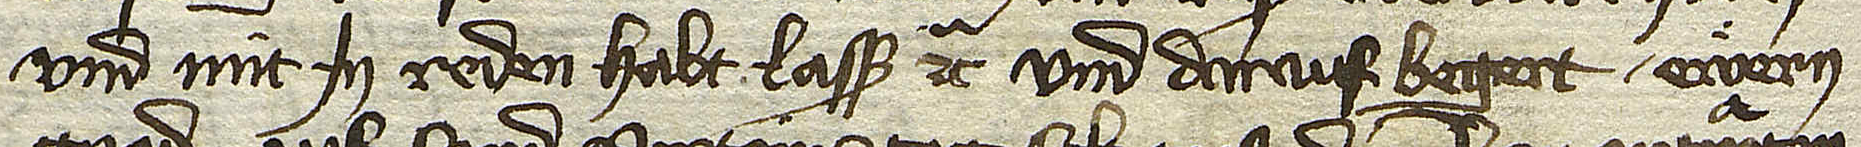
vnd mit In reden habt . laſſ* ec* vnd darauf begert / ewern
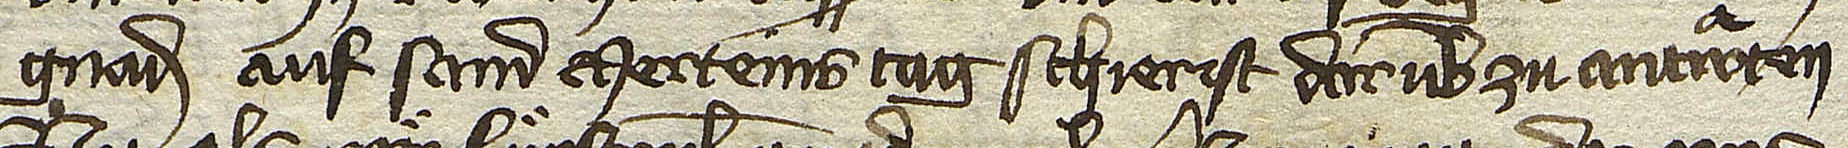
gnad* auf ſand Merteins tag ſchieriſt dar*ub ʒu antw*ten
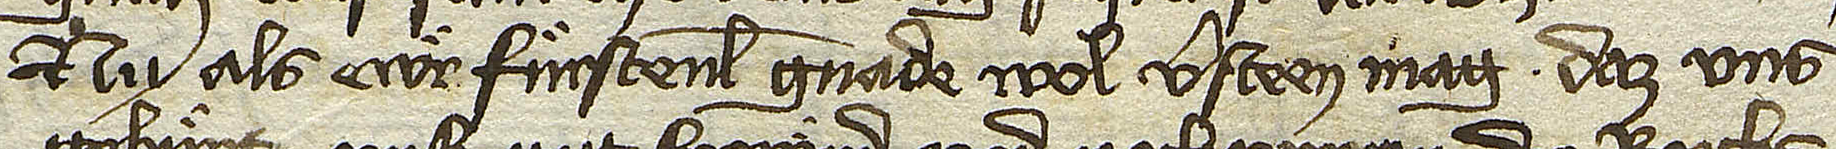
Nu als ewr fürſtenl* gnade wol v*ſteen mag . daʒ vns
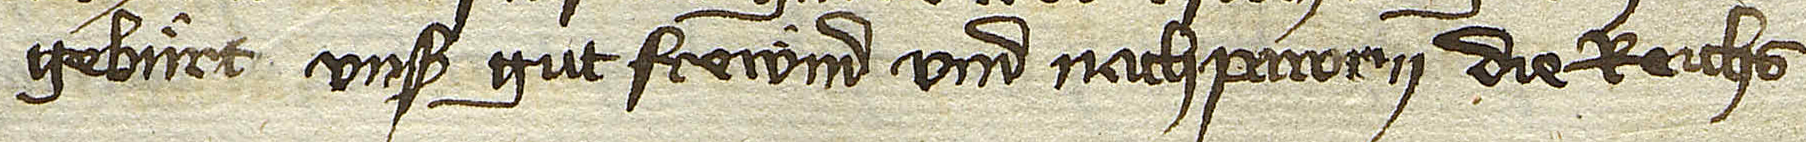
gebürt vnſʒ gut frewd vnd nachpawrn die Reichs
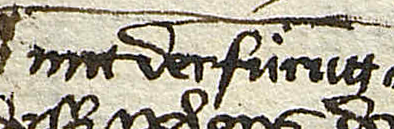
mit der fürug*
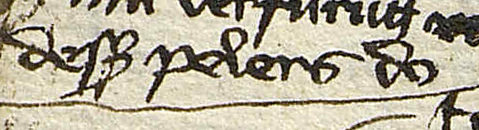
deſſ* pelers do
